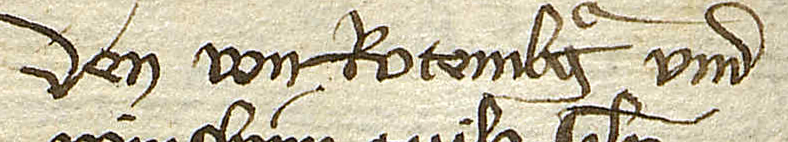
Den von Rotembg* vnd
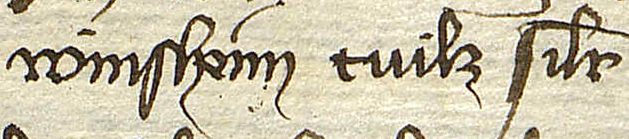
winſheim cuil* ſilr*
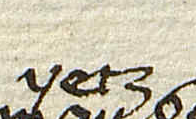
yecʒ
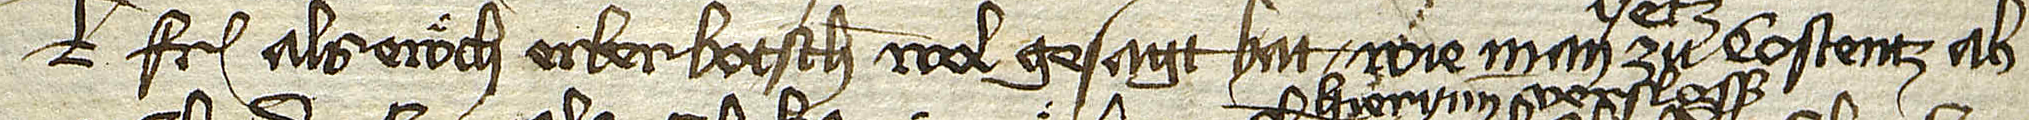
L* fr* als ewch erber botſch* wol geſagt hat / wie man ʒu Coſtencʒ ab -
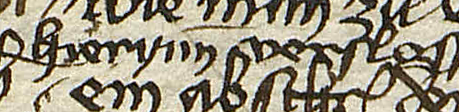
hierynn* verſloſſ*
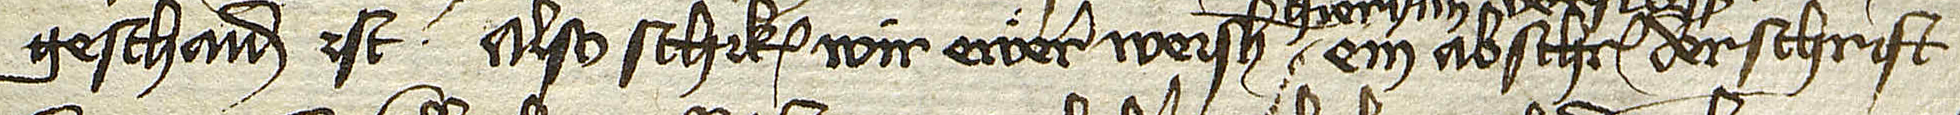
geſchaid* iſt . alſo ſchik* wir ewer* weiſh* / ein abſchr* der ſchrift
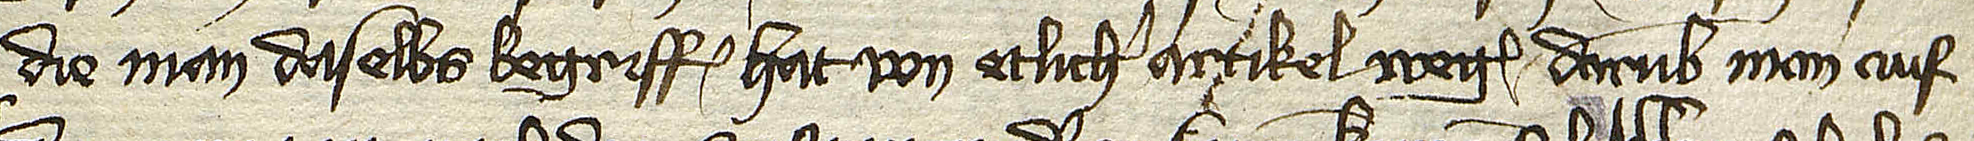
die man daſelbs begriff* hat von etlich* artikel weg* darub* man auf
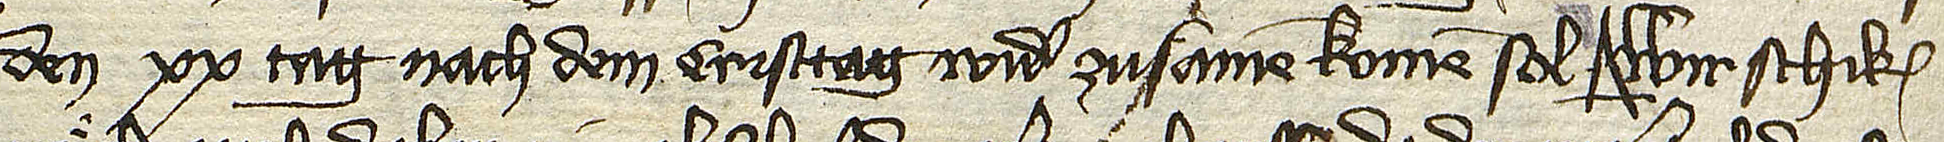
den xx tag nach dem Criſttag wid* ʒuſame* kome* ſol / Wir ſchik*
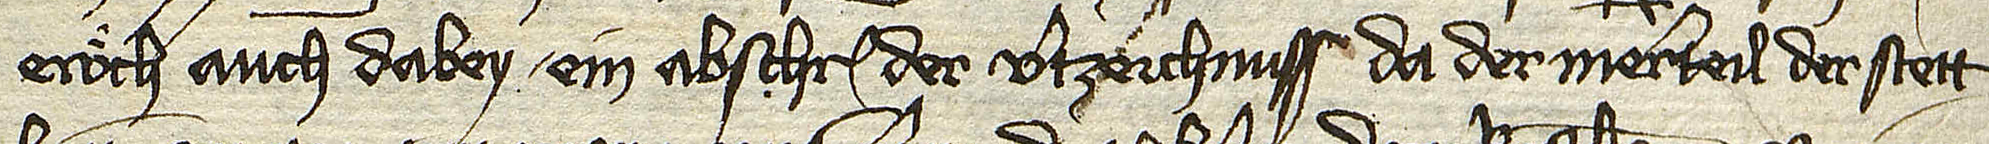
ewch auch dabey / ein abſchr* der v*cʒeichnuſſ da der mer*teil der ſtett
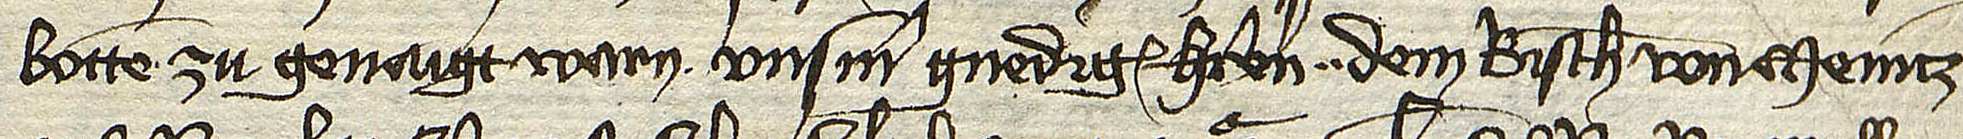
botte* ʒu genaigt warn . vnſm* gnedig* hr*en ~ dem Biſch* von Meincʒ
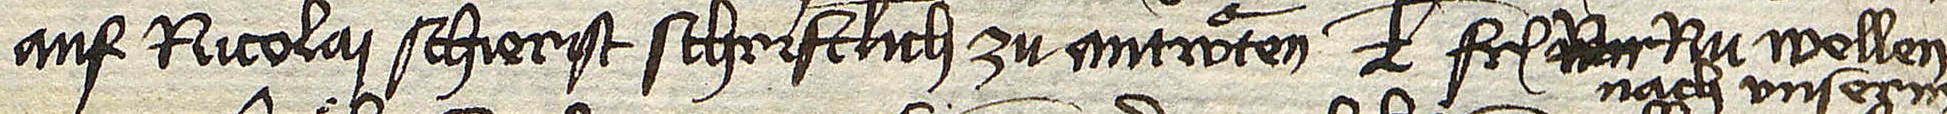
auf Nicolai ſchieriſt ſchriftlich ʒu antw*ten L* fr* wir Nu wellen
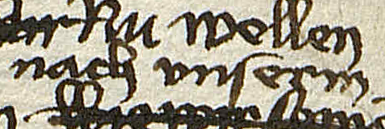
nach vnſerm
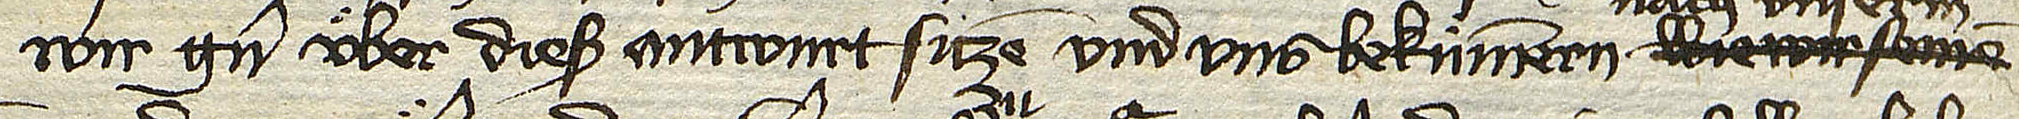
wir gn* v̈ber dieſ* antwurt ſicʒe* vnd vns beküm*ern / Wie wir ſeine*
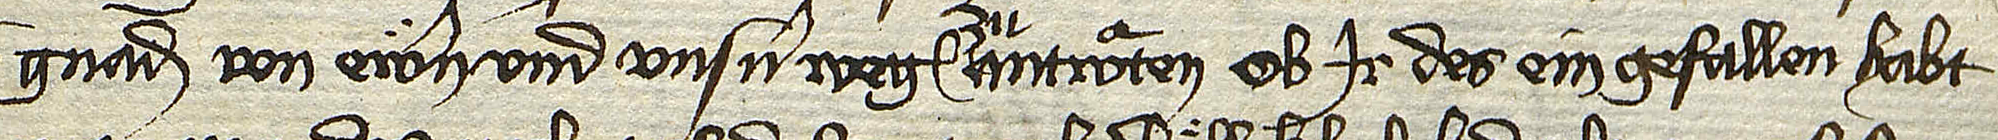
gnad* von ew*n vnd vnſn* weg* antw*ten Ob Ir des ein gefallen habt
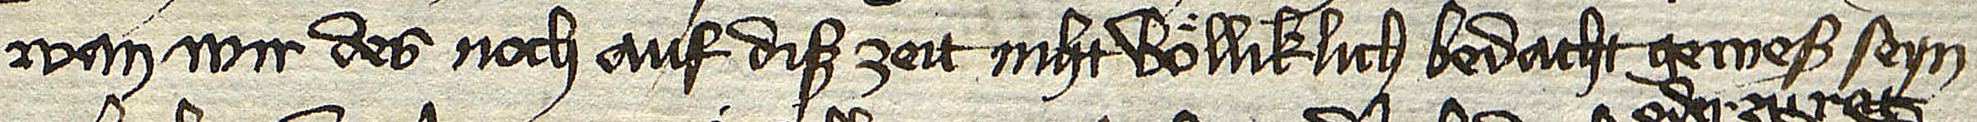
wan wir des noch auf diſʒ ʒeit niht völliklich bedacht geweſ* ſeyn
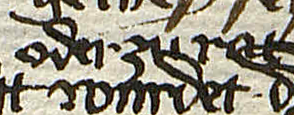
oder ʒu rat
